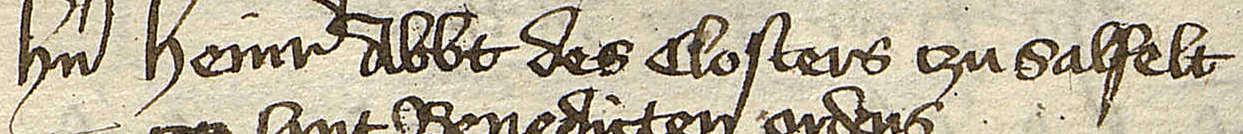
hn* heinr* Abbt des Cloſters cʒu Salfelt
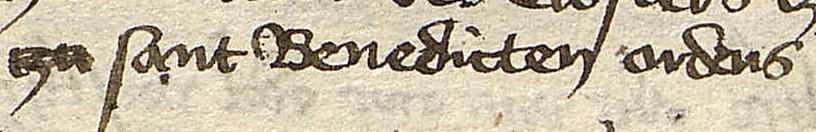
cʒu ſant Benedicten ordens
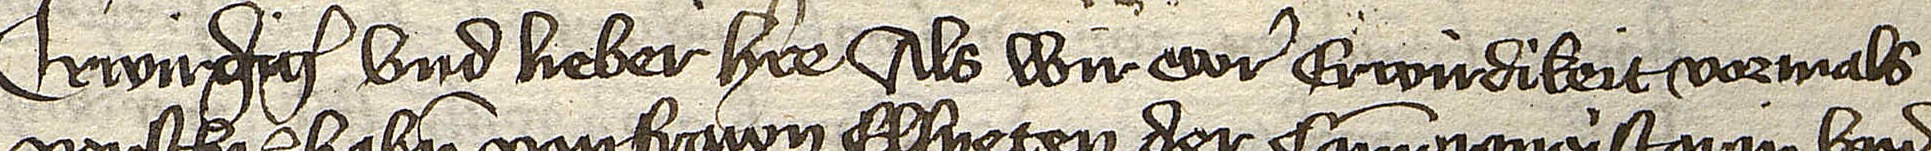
Erwirdig* vnd lieber h*re Als wir ewr* Erwirdikeit vormals
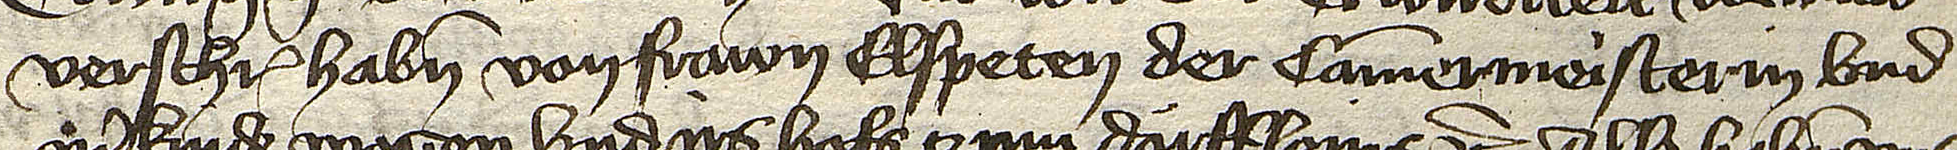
verſchr* habn* von frawn Elſpeten der Cam*ermeiſterin vnd
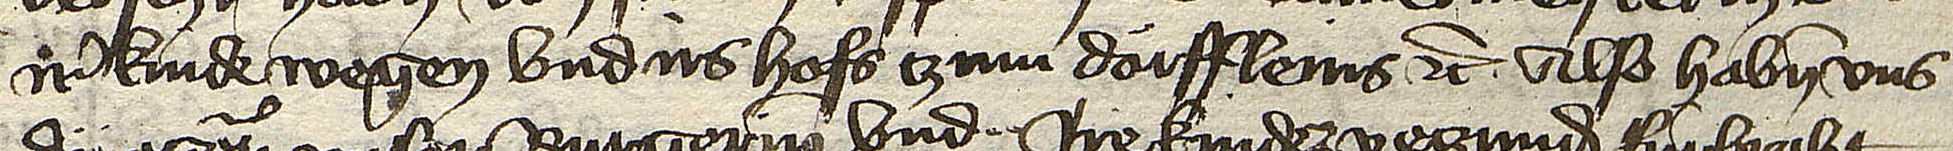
ir* kinde wegen vnd irs hofs cʒum dörffleins ec* Alſo habn* vns
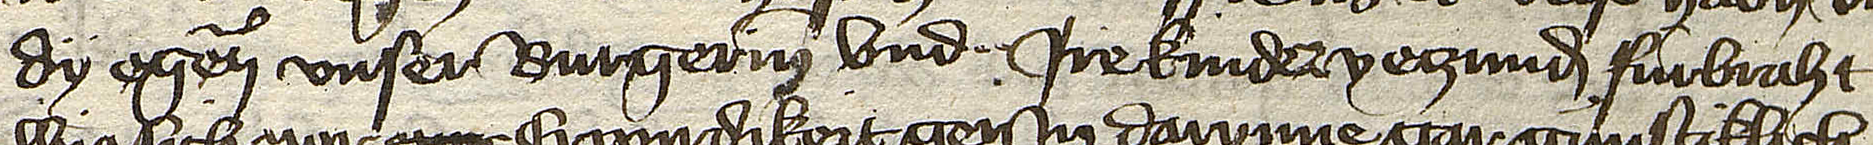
dy egen* vnſer Burgerin* vnd ~ Ire kinder yecʒund* fürbraht
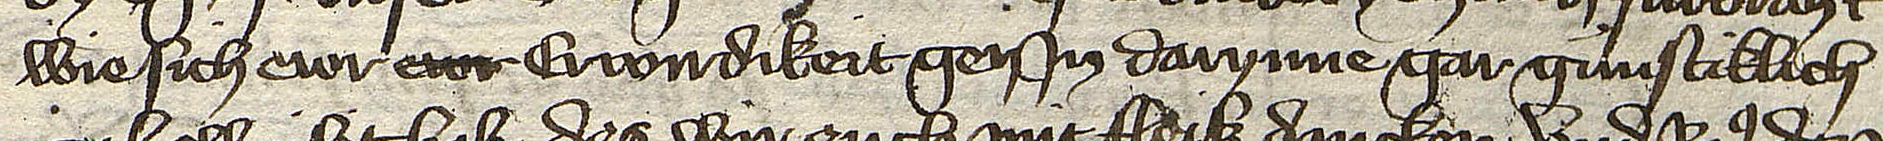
wie ſich ewr ewr Erwirdikeit gen In darynne gar günſtiklich
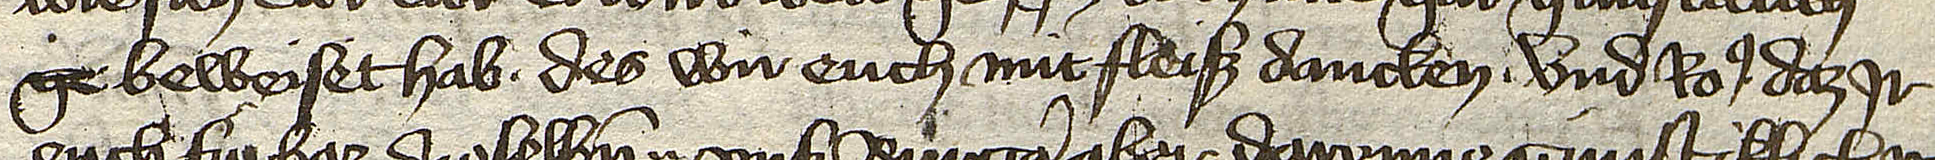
ge beweiſet hab . des wir euch mit fleiſʒ dancken . Vnd Ro* . daʒ Ir
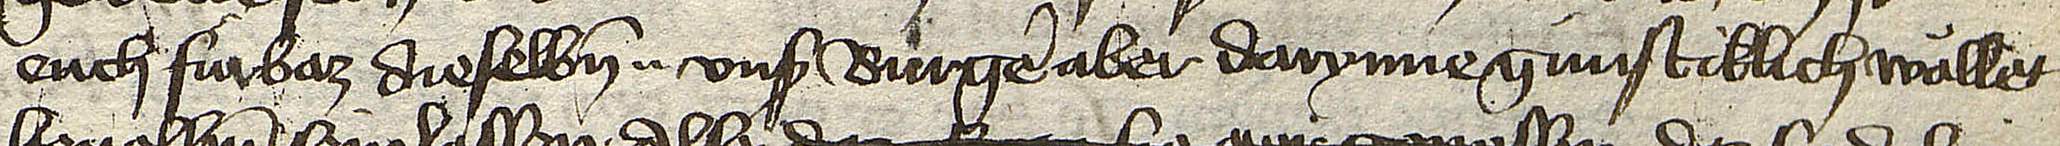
euch fürbaʒ dieſelbn* ~ vnſ* Burge* aber darynne günſtiklich wöllet
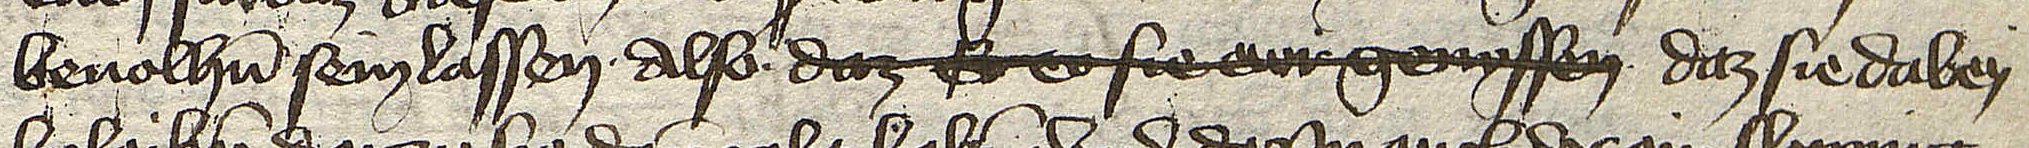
beuolhn* ſein laſſen . Alſo . daʒ Er ew ſie ewr genyſſen . daʒ ſie dabey
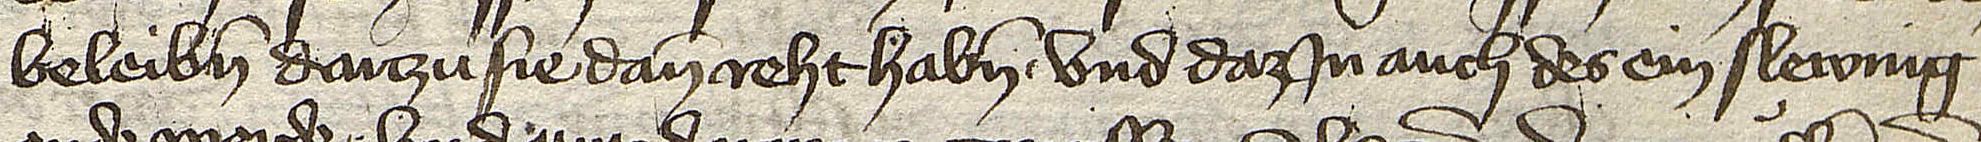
beleibn* darcʒu ſie dan* reht habn* / vnd daʒ In auch des ein ſlewnig
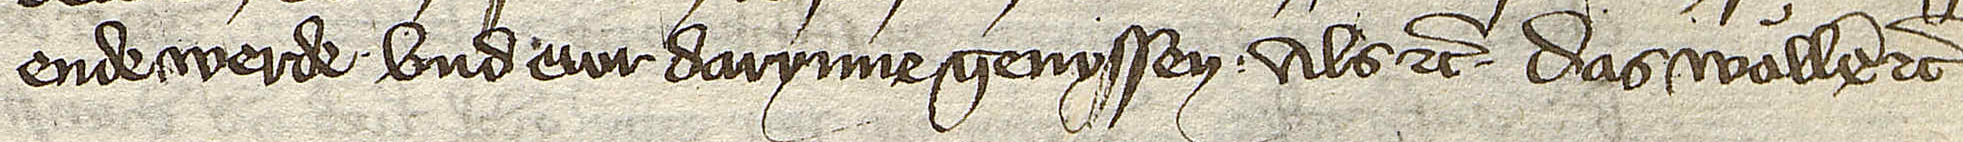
ende werde vnd ewr darynne genyſſen . Als ec* Das wölle* ec*
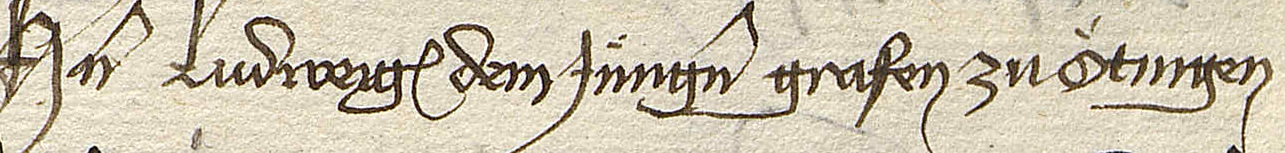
Hn* Ludweig* dem Iüngn* grafen ʒu Ötingen
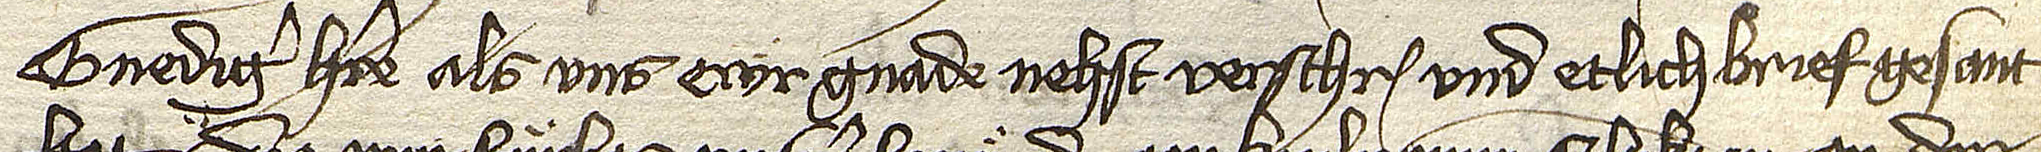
Gnedig* h*re als vns eẅr gnade nehſt verſchr* vnd etlich brief geſant
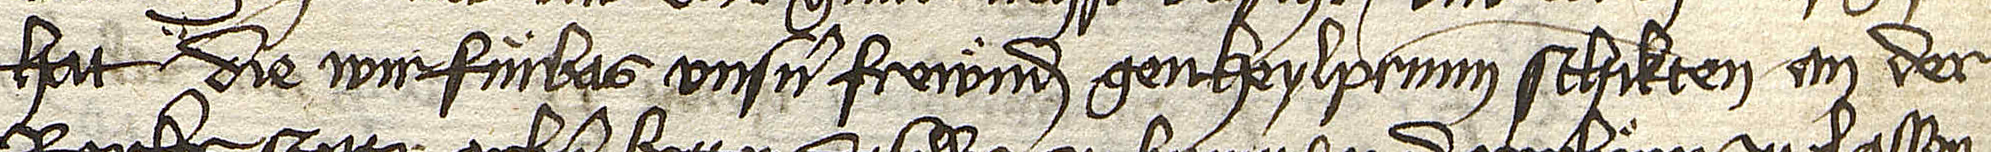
hat / Die wir fürbas vnſn* freẅnd* gen Heylprunn* ſchikten / an der
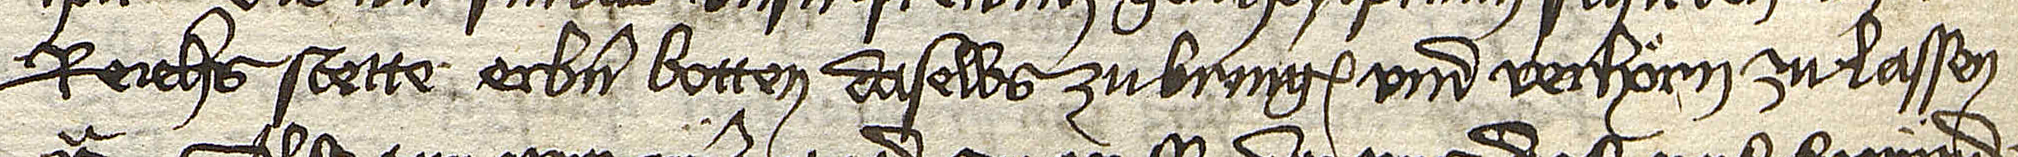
Reichs ſtette erbn* botten daſelbs ʒu bring* vnd verhörn ʒu laſſen
